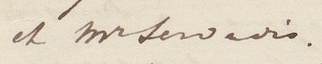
et MrServadio.
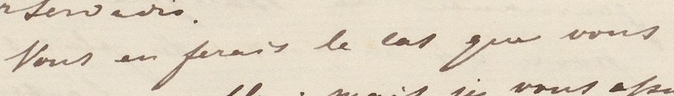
Vous en ferais le cas que vous
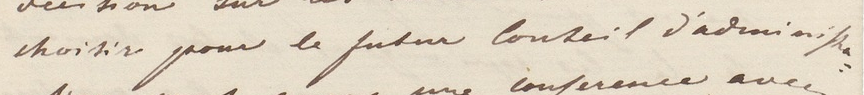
choisir pour le futur Conseil d'administra-
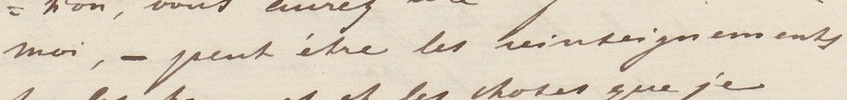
moi, – peut être les reinseignements
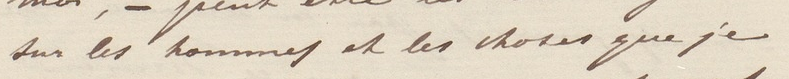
sur les sommes et les choses que je
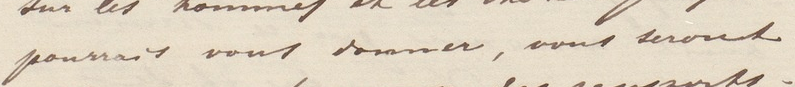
pourrais vous donner, vous seront
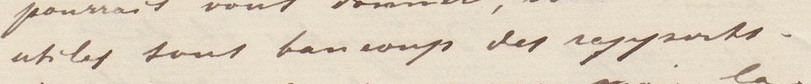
utiles sous beaucoup des rapports.
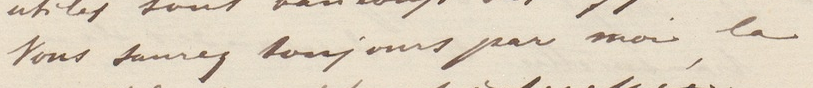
Vous saurez toujours par moi la
